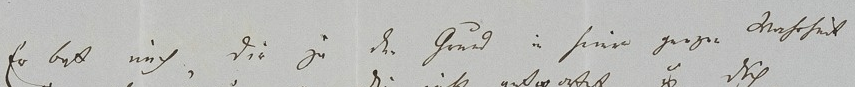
Er bat mich, Dir ja den Grund in seiner ganzen Wahrheit
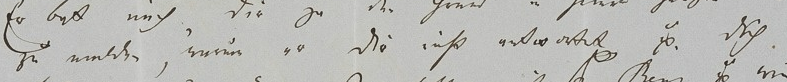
zu melden, warum er Dir nicht antwortet &. Dich
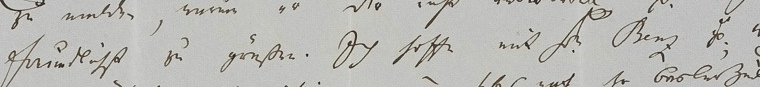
freundlichst zu grüßen. Ich hoffe mit Hr. Benz &.;
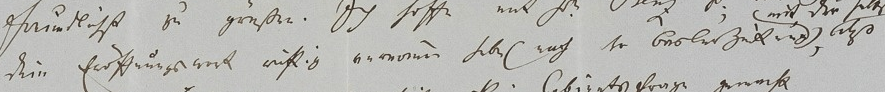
Dein Eröffnungswort richtig vernommen habe (nach der Basler Zeitung) mit Dir
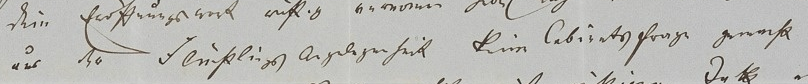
aus der Flüchtlings Angelegenheit keine Cabinetsfrage gemacht
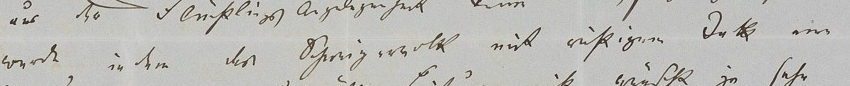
werde, in dem das Schweizervolk mit richtigen Takt eine
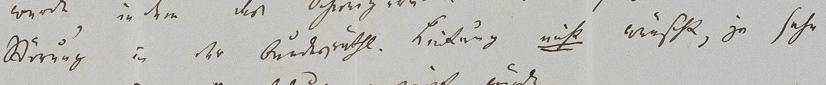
Störung in der bundesräthl. Leitung nicht wünscht, ja sehr
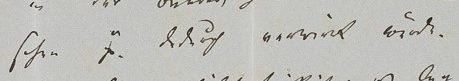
sehen &. dadurch verwirrt würde.
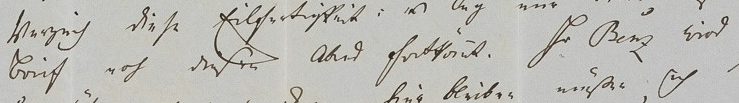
Brief noch diesen Abend fortkommt. Hr Benz wird
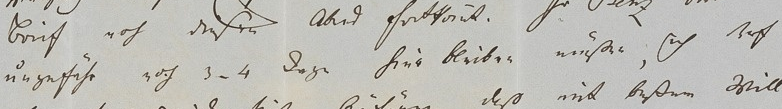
ungefähr noch 3–4 Tage hier bleiben müssen; ich darf
